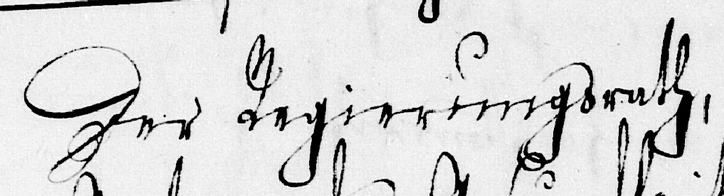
Der Regierungsrath,
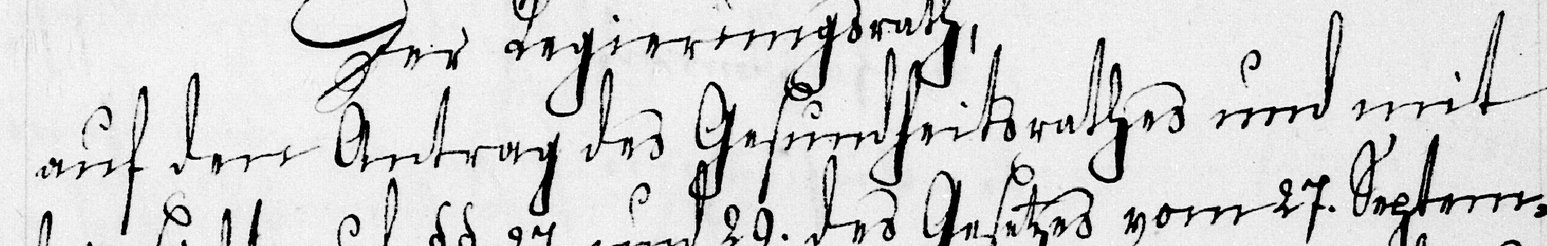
auf den Antrag des Gesundheitsrathes und mit
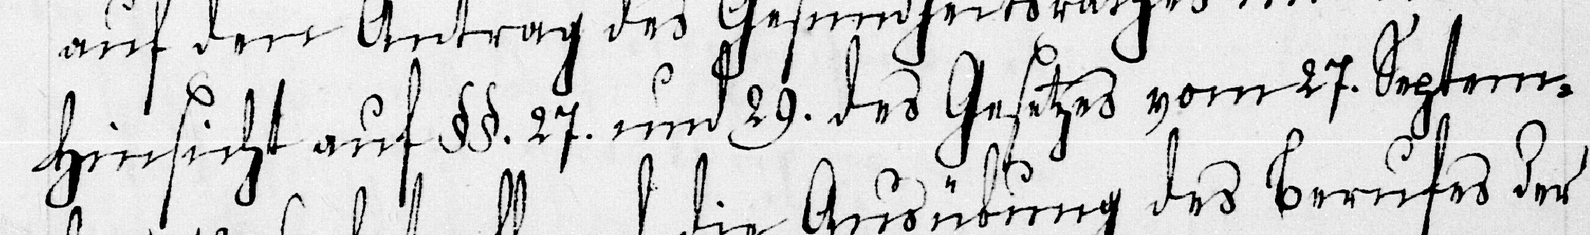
Hinsicht auf §§. 27. und 29. des Gesetzes vom 27. Septem¬
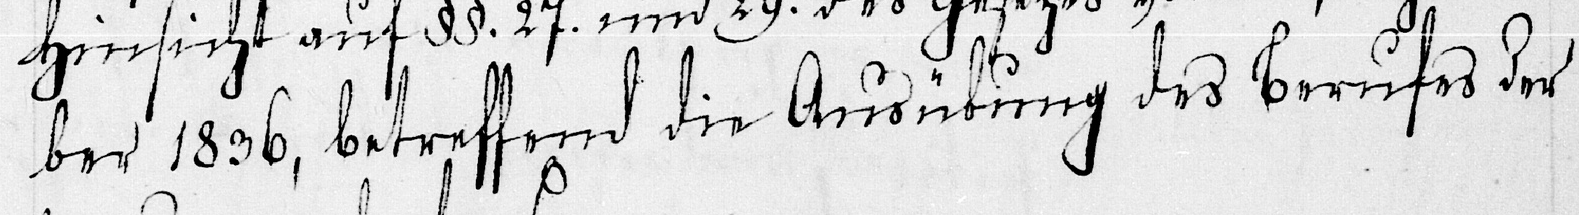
ber 1836, betreffend die Ausübung des Berufes der
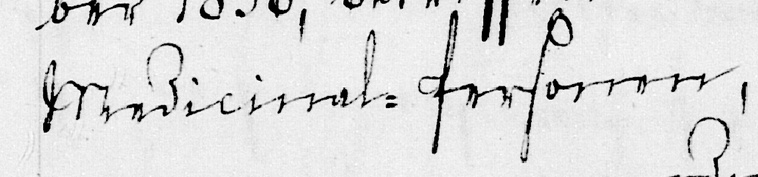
Medicinal-Personen,
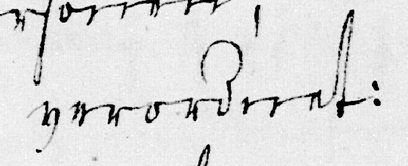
verordnet:
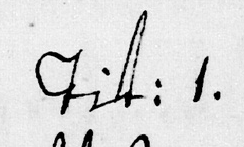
Tit: I.
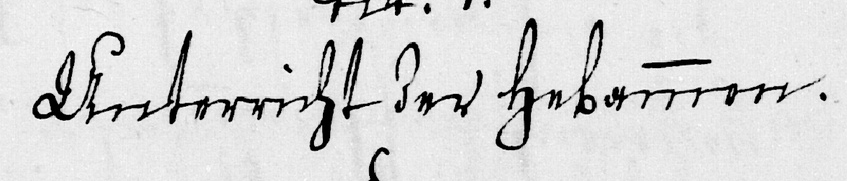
Unterricht der Hebammen.
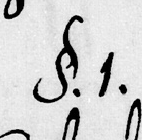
§. 1.
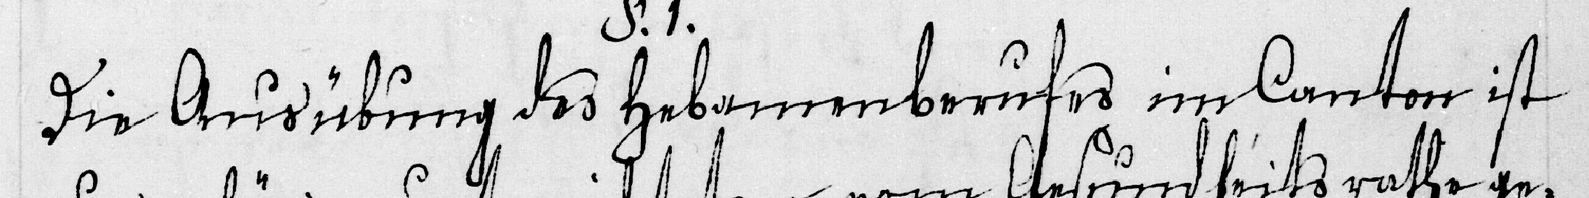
Die Ausübung des Hebammenberufes im Canton ist
